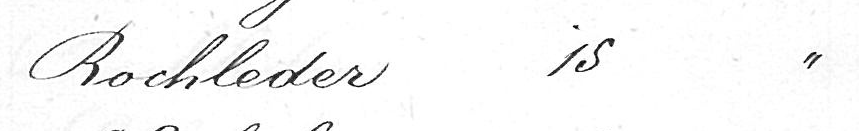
Rochleder 15 "
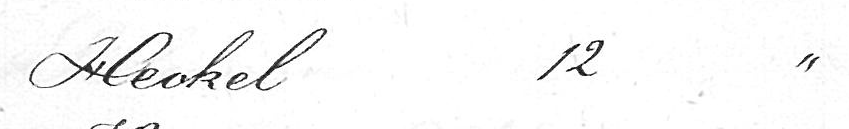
Heckel 12 "
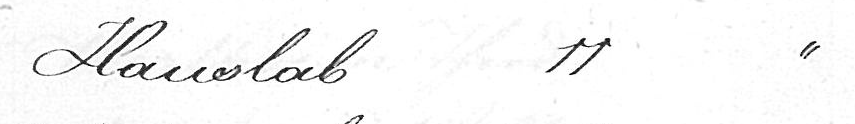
Hauslab 11 "
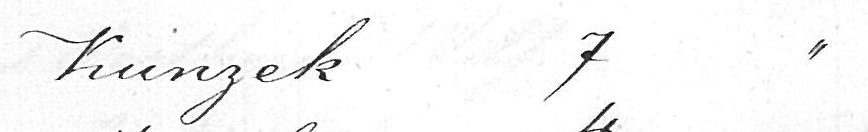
Kunzek 7 "
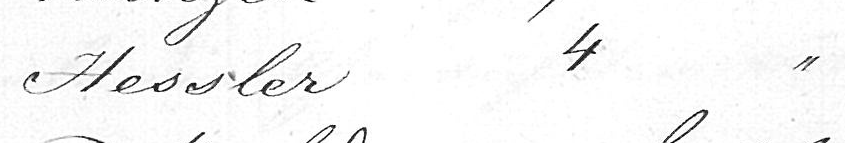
Hessler 4 "
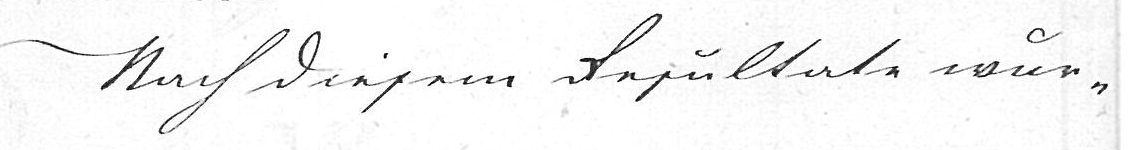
Nach diesen Resultat wur-
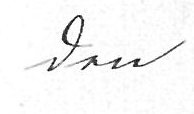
den
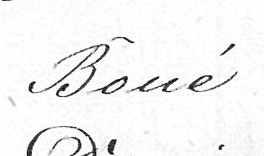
Boué
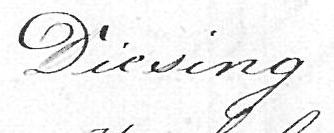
Diesing
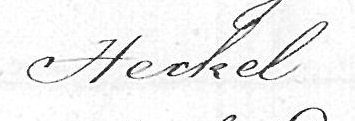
Heckel
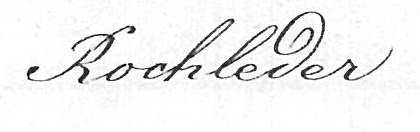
Rochleder
